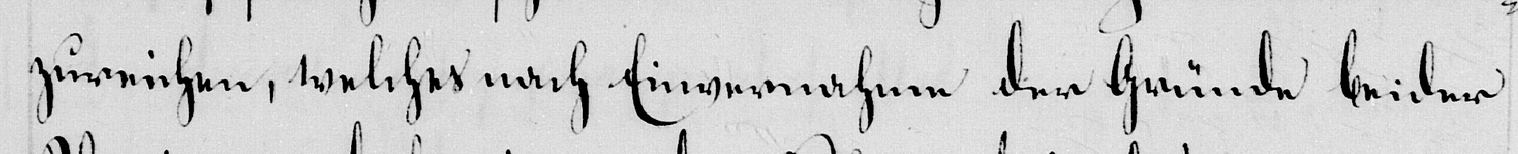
zureichen, welches nach Einvernahme der Gründe beider
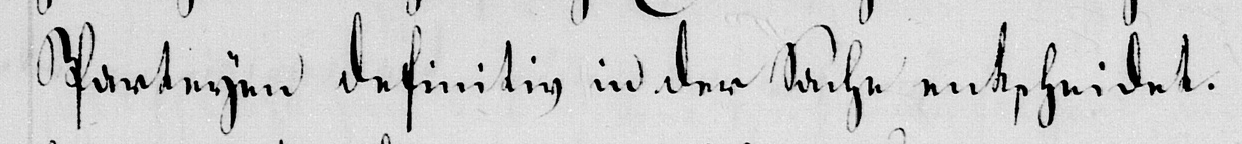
Parteyen definitiv in der Sache entscheidet.
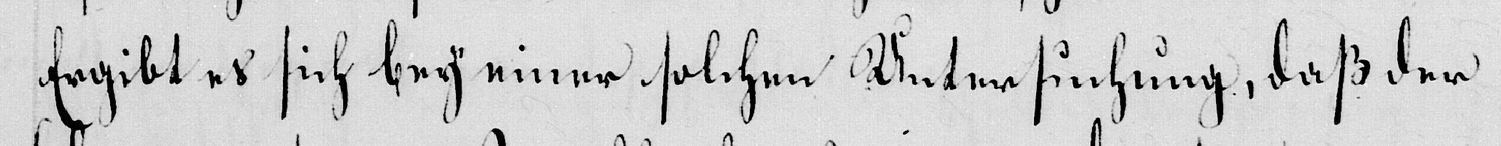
Ergibt es sich bey einer solchen Untersuchung, daß der
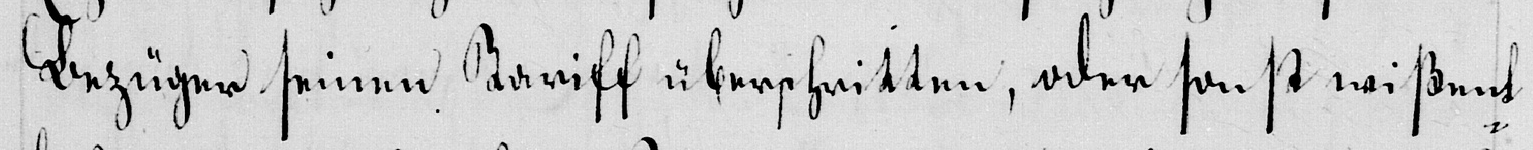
Bezüger seinen Tariff überschritten, oder sonst wißent¬
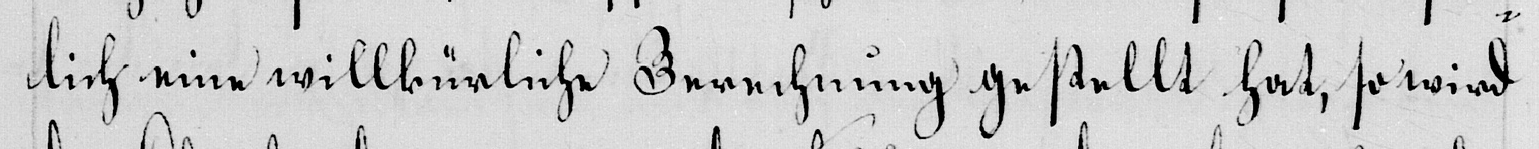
lich eine willkürliche Berechnung gestellt hat, so wird
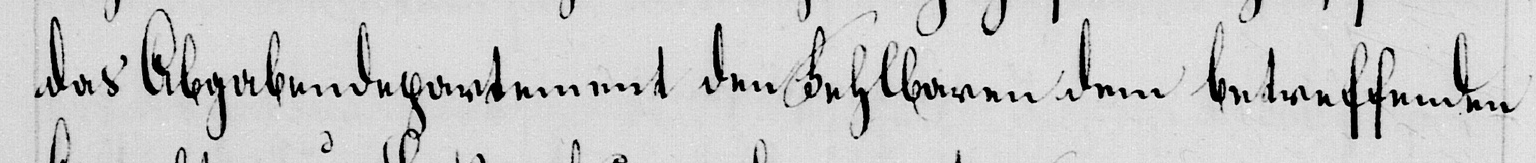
das Abgabendepartement den Fehlbaren dem betreffenden
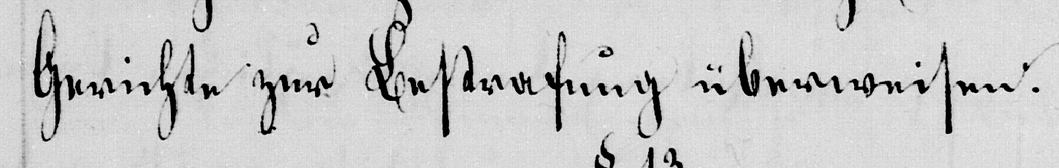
Gerichte zur Bestrafung überwiesen.
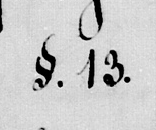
§. 13.
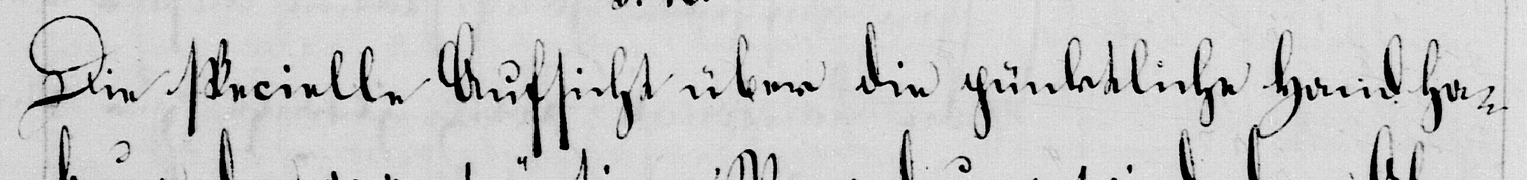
Die specielle Aufsicht über die pünktliche Handha¬
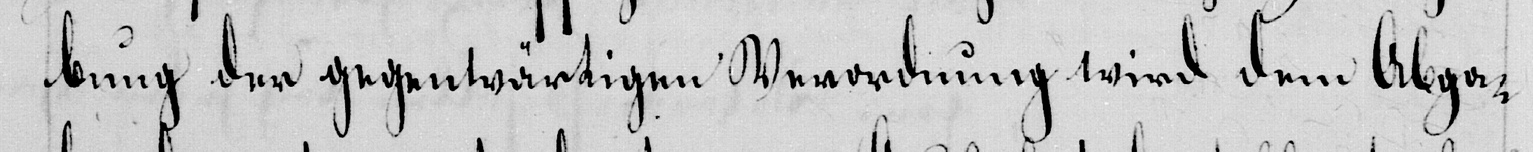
bung der gegenwärtigen Verordnung wird dem Abga¬
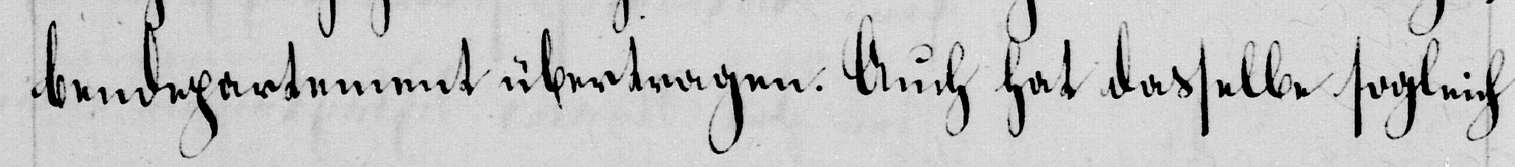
bendepartement übertragen. Auch hat dasselbe sogleich
